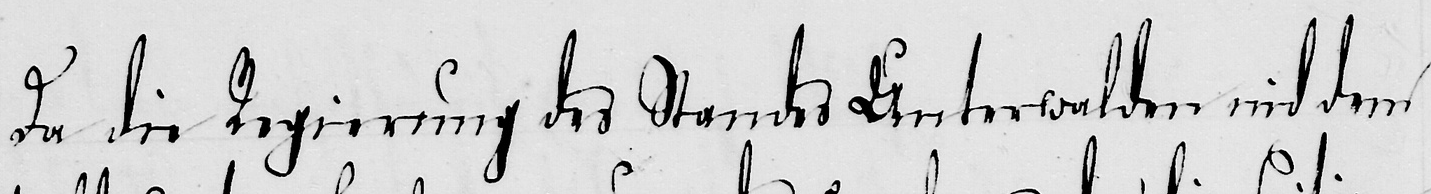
Da die Regierung des Standes Unterwalden nid dem
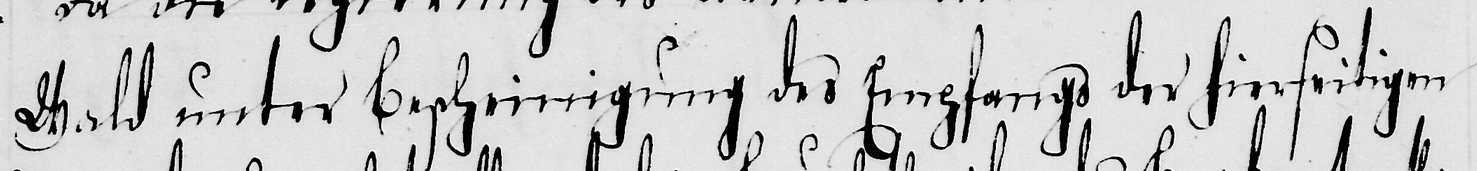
Wald unter Bescheinigung des Empfangs der hierseitigen
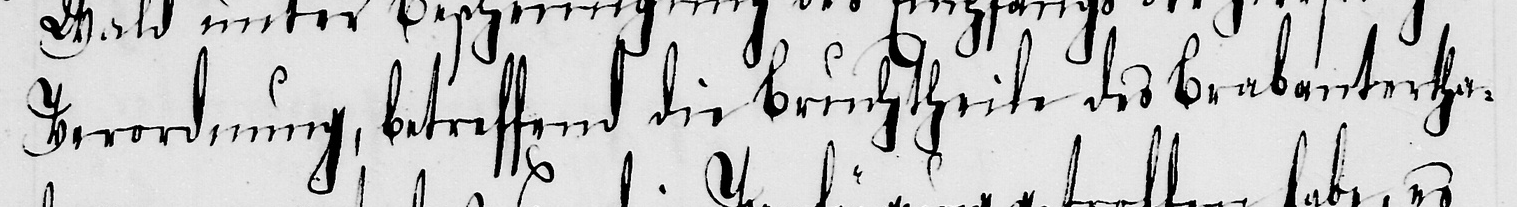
Verordnung, betreffend die Bruchtheile des Brabantertha¬
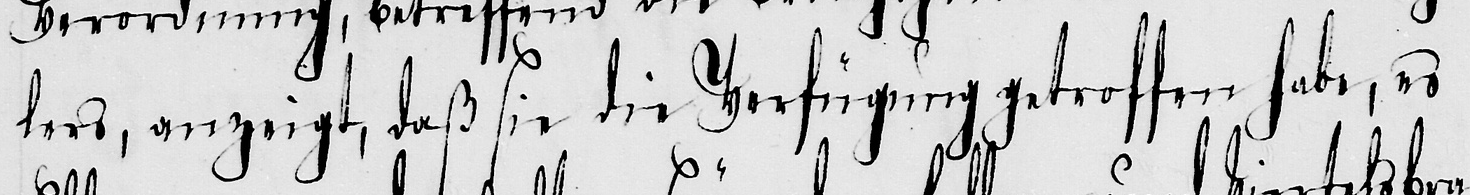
lers, angezeigt, daß sie die Verfügung getroffen habe, es
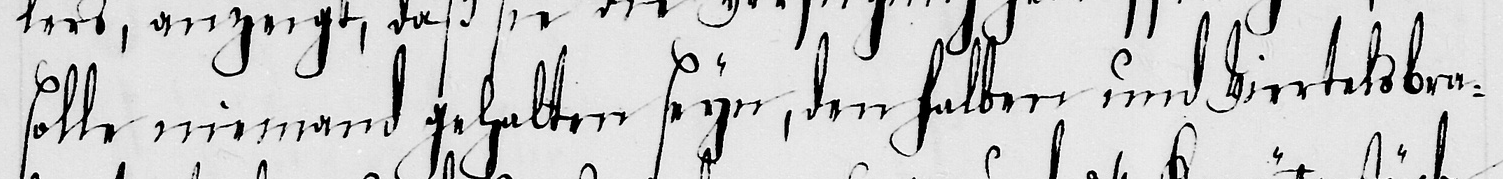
solle niemand gehalten seyn, den halben und Viertelsbra¬
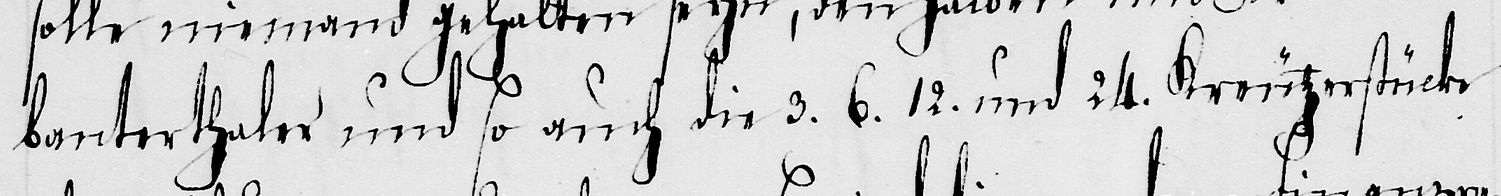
banterthaler und so auch die 3. 6. 12. und 24. Kreutzerstücke
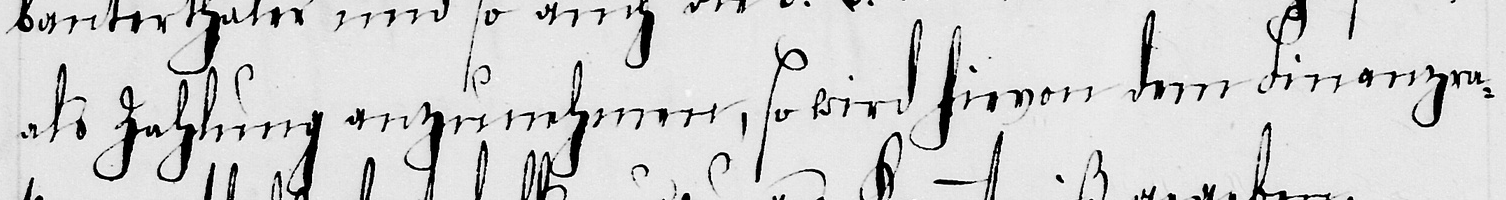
als Zahlung anzunehmen, so wird hievon dem Finanzra¬
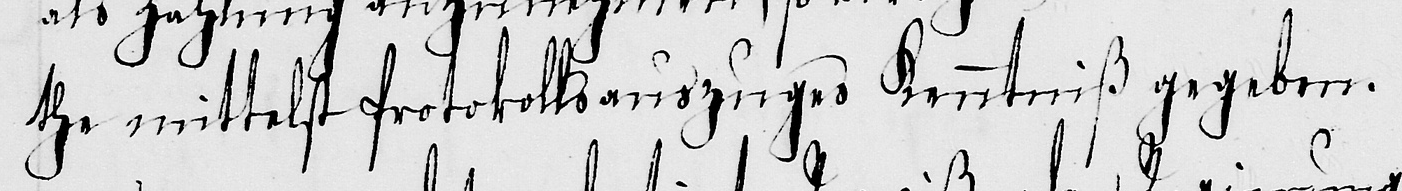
the mittelst Protokollsauszuges Kenntniß gegeben.
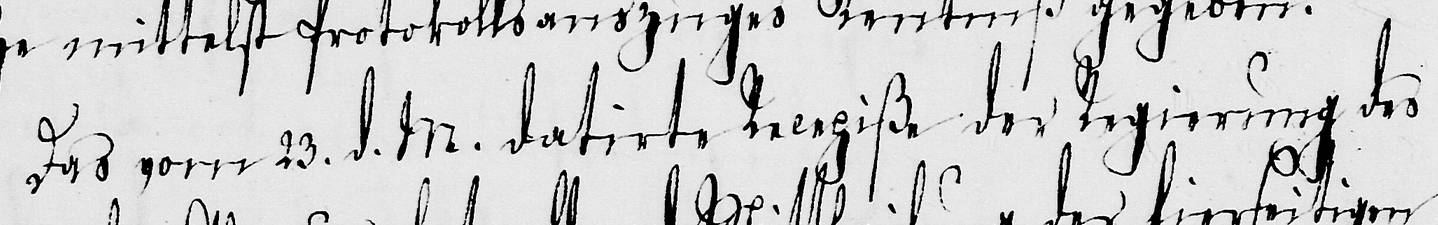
Das vom 23. d. M. datirte Recepiße der Regierung des
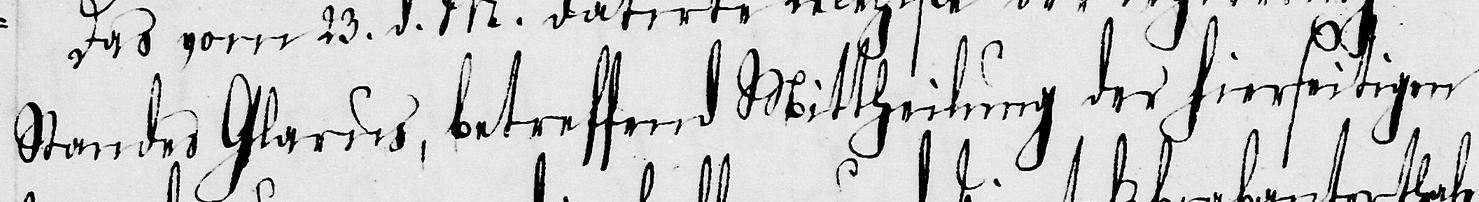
Standes Glarus, betreffend Mittheilung der hierseitigen
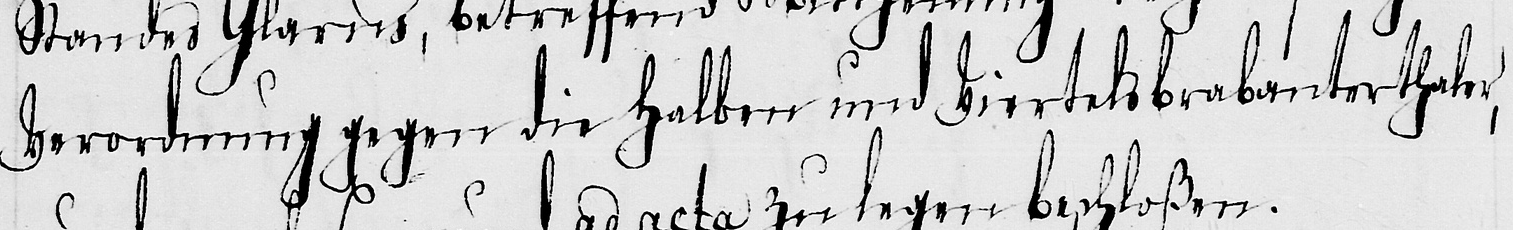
Verordnung gegen die halben und Viertelsbrabanterthale¬
